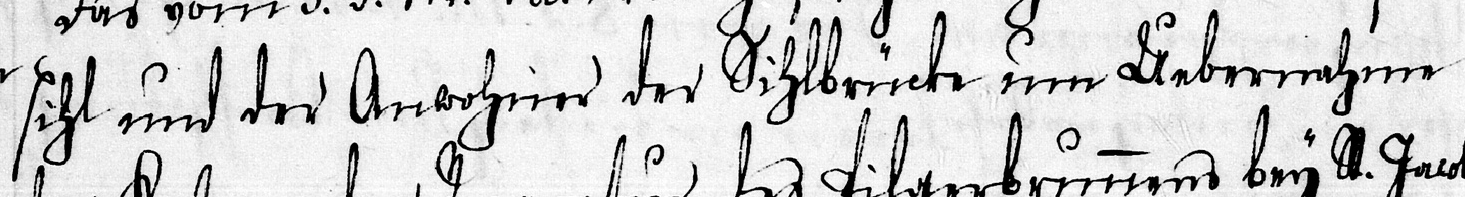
sihl und der Anwohner der Sihlbrücke um Uebernahme
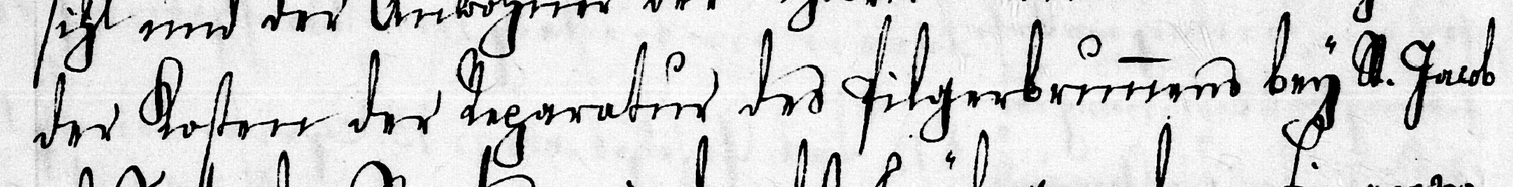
der Kosten der Reparatur des Pilgerbrunnens bey St. Jacob
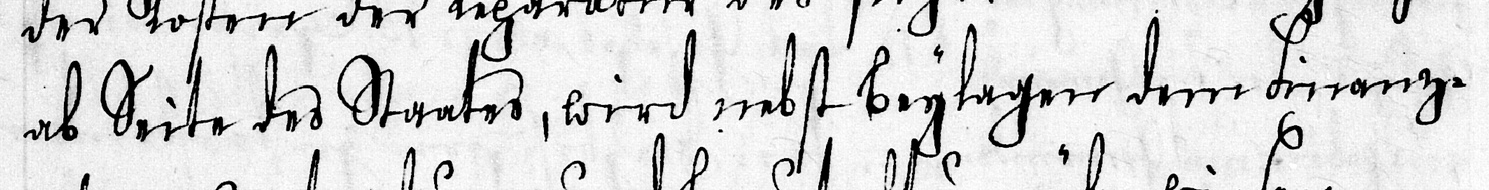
ab Seite des Staates, wird nebst Beylagen dem Finanz¬
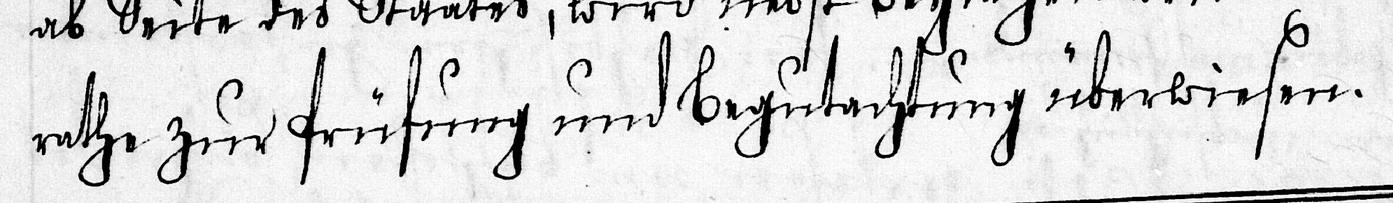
rathe zur Prüfung und Begutachtung überwiesen.
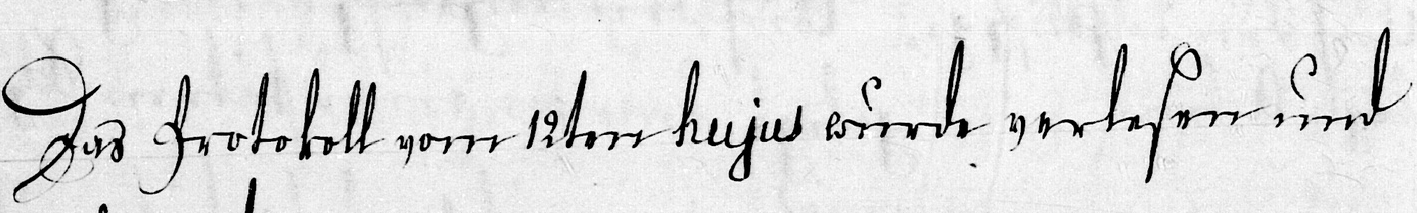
Das Protokoll vom 12ten hujus wurde verlesen und
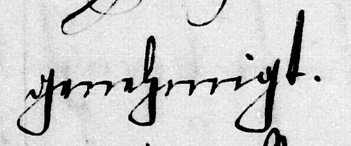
genehmigt.
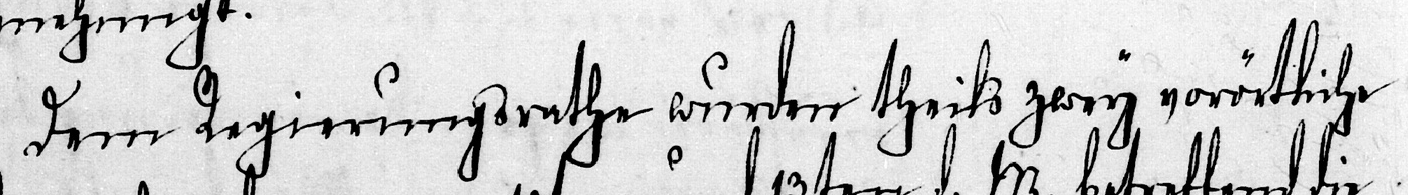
Dem Regierungsrathe wurden theils zwey vorörtliche
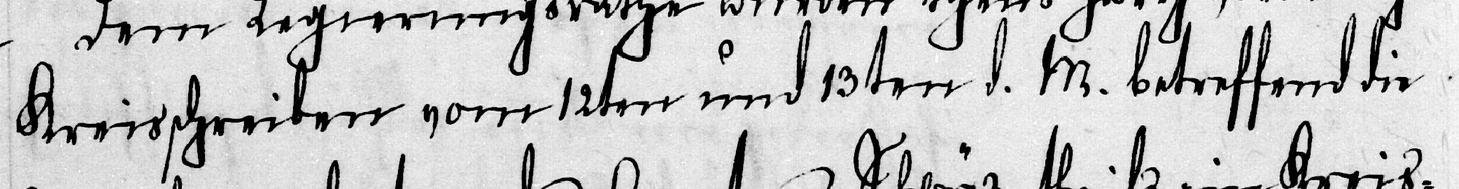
Kreisschreiben vom 12ten und 13ten d. M. betreffend die
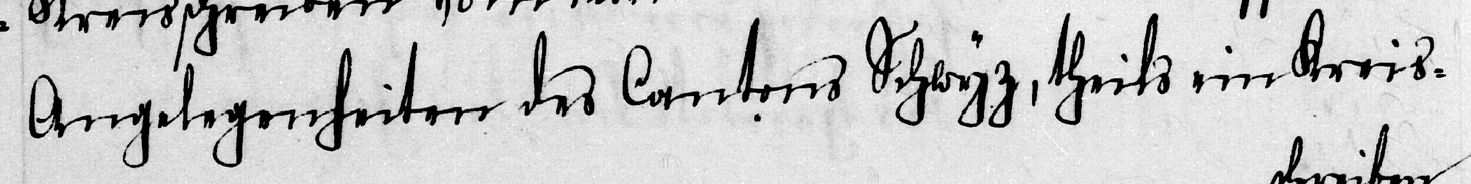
Angelegenheiten des Cantons Schwyz, theils ein Kreis-
